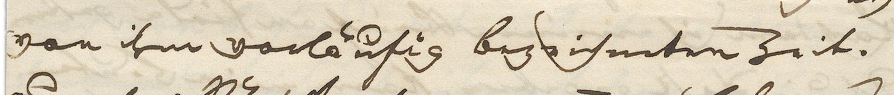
von ihm vorläufig bezeichneten Zeit-
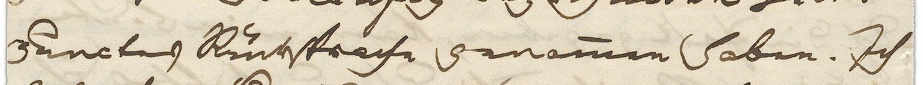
punctes Rücksprache genommen haben. Ich
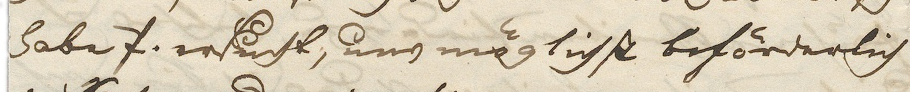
habe P. ersucht, uns möglichst beförderlich
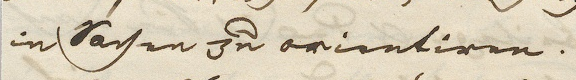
in Sachen zu orientiren.
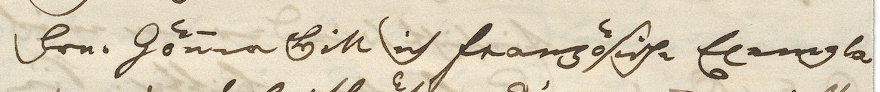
Hrn. Gönner will ich französische Exempla-
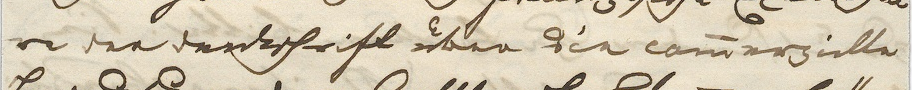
re der Denkschrift über die commerzielle
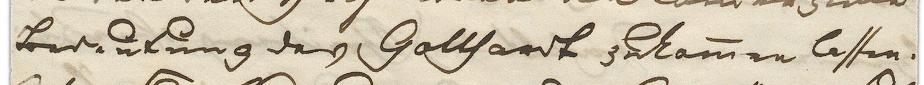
Bedeutung des Gotthardt zukommen lassen.
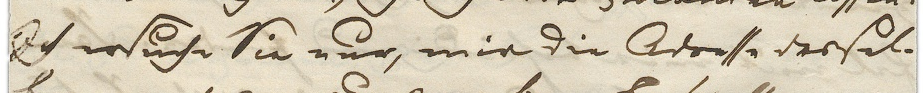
Ich ersuche Sie nur, mir die Adresse dessel-
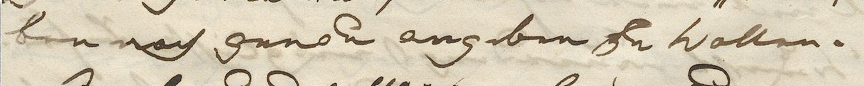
ben noch genau angeben zu wollen.
